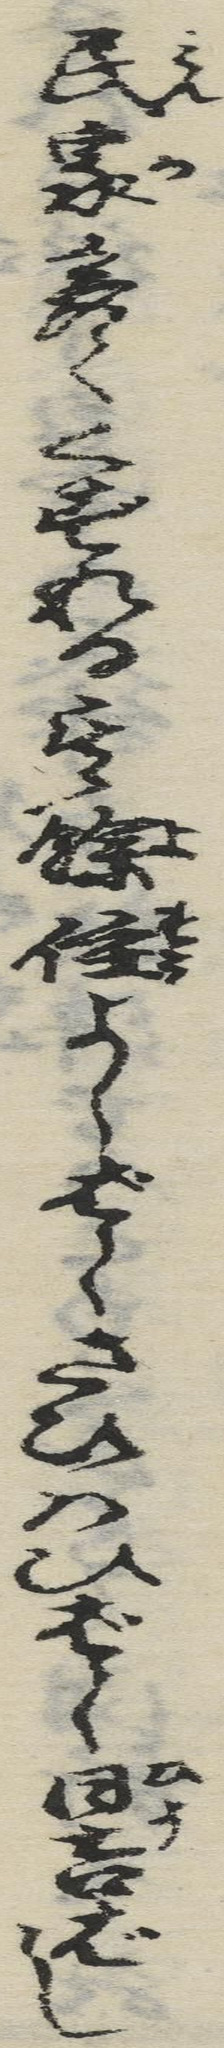民家多くくずれる其余住よしばしさひはひばし日吉ばし
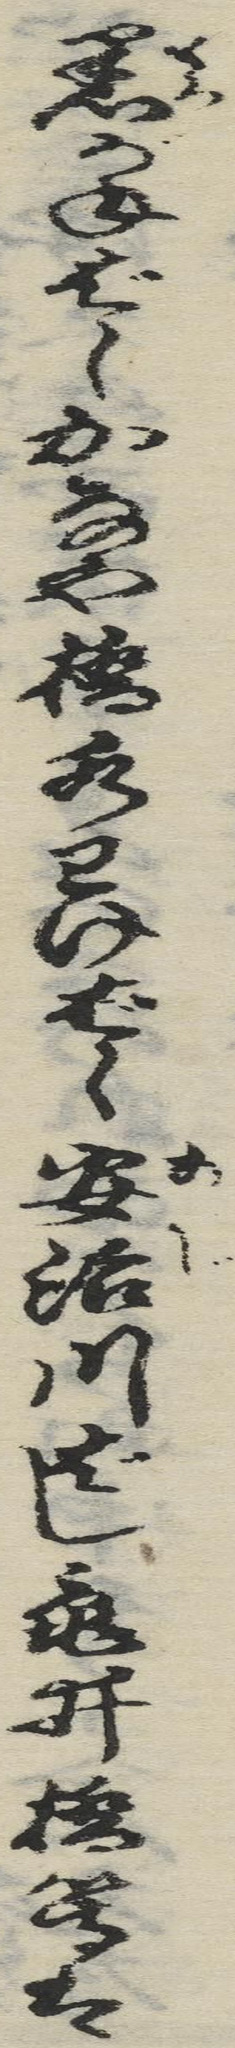黒がねばしかなや橋水わけばし安治川ばし亀井橋等は
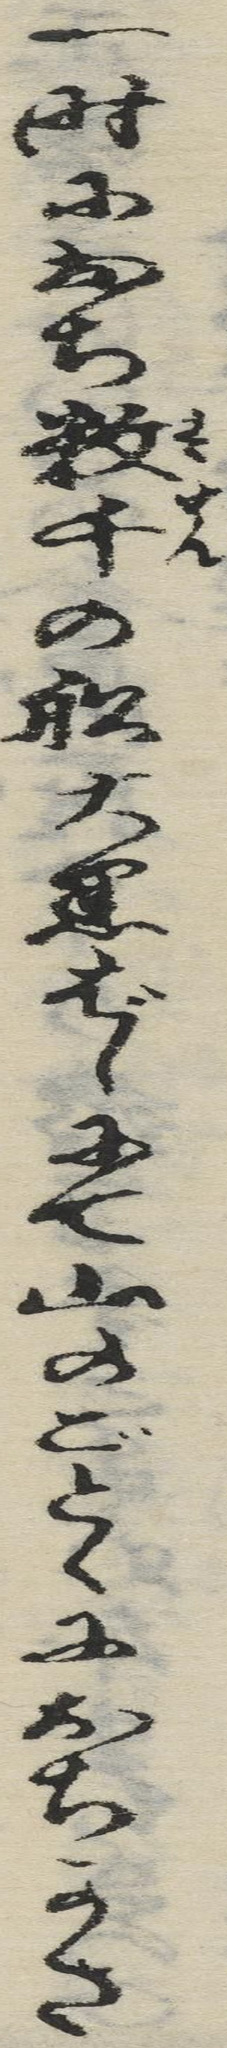一時におち数千の舩大黒ばしにて山のごとくにおちかさ
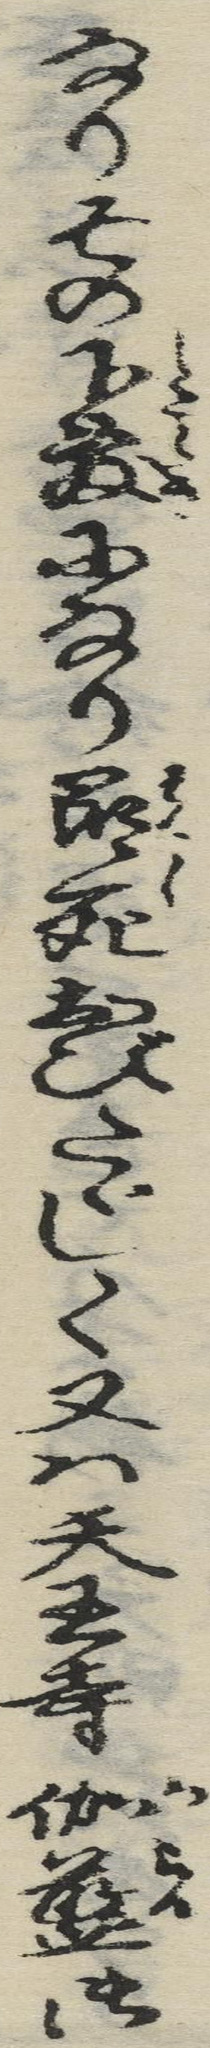なりその下敷になり即死おびたゞしく又は天王寺伽藍御
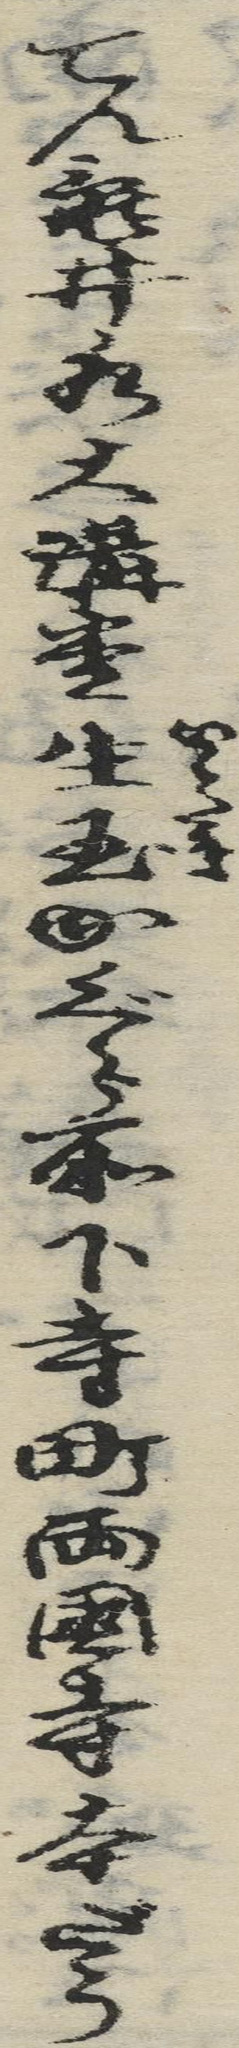てん亀井水大講堂生玉かぐら所下寺町両国寺本だう
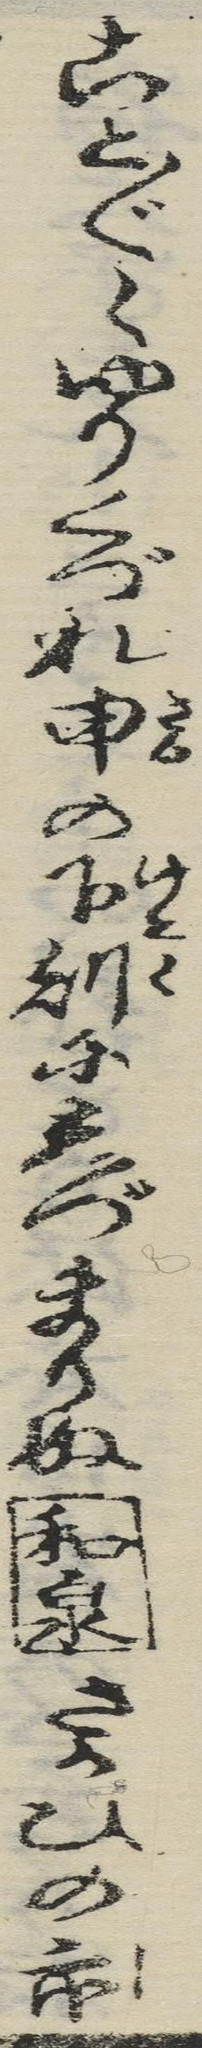こと〴〵くゆりくづれ申の下刻にしづまりぬ和泉さかひの市
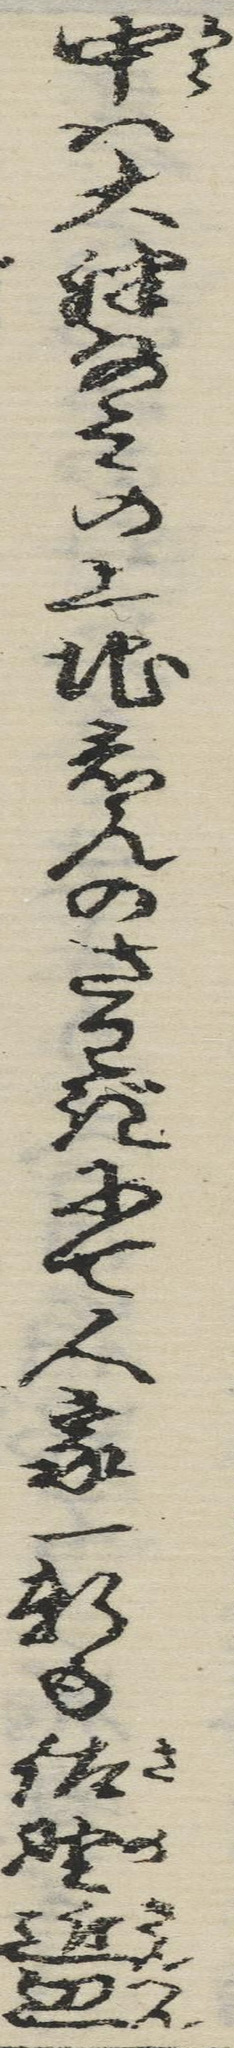中は大つなみその上地しんのさわぎにて人家一軒も佐野近辺
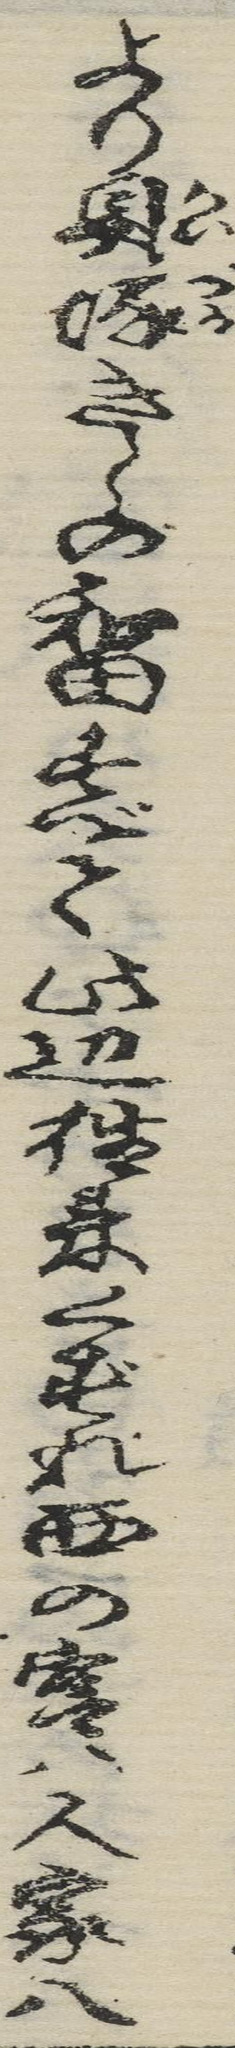より貝塚きしの和田すべて此辺往来くずれ西の宮は人家八
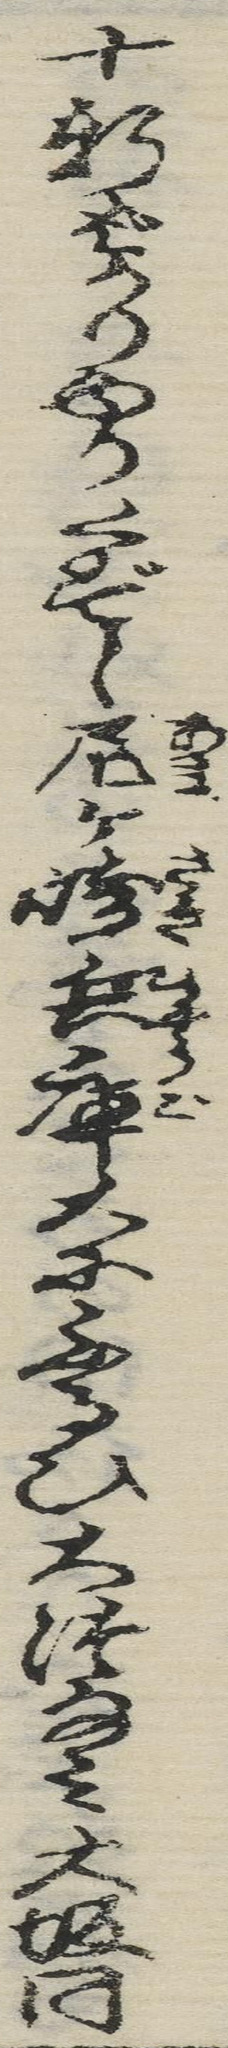十軒ばかりゆりくずし尼ケ崎兵庫大にふるひ大つなみ大坂同
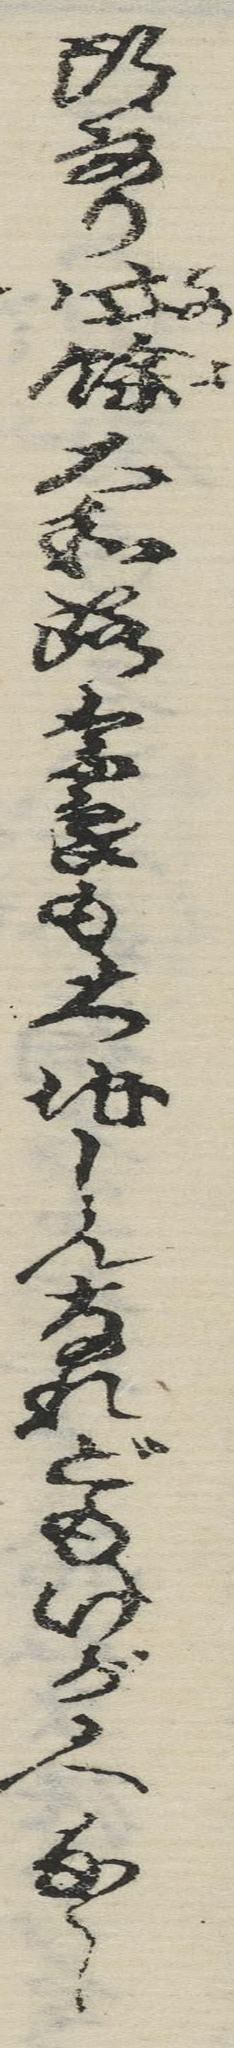断なり此余大和路奈良も大地しんなれどもけが人なし
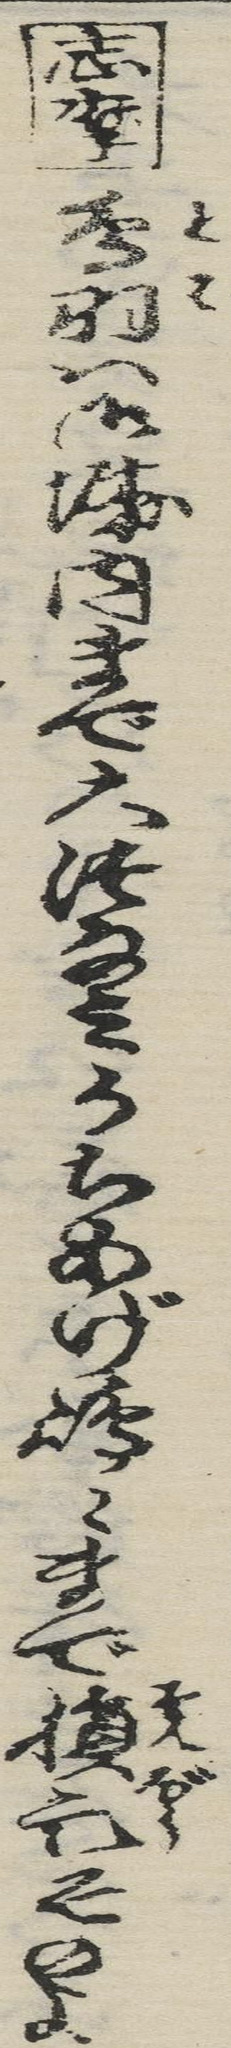志摩鳥羽は御城内まで大つなみうちあげ嶋々まで損亡そのよ
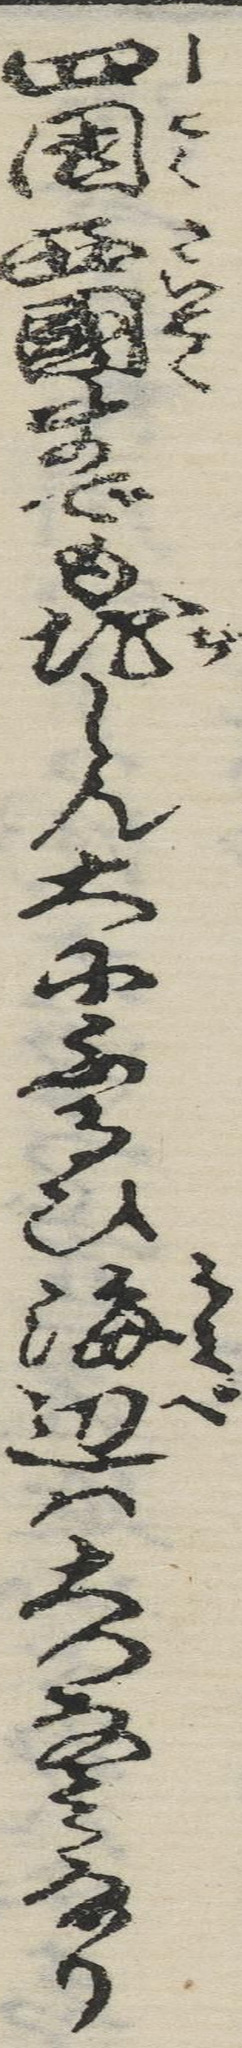四国西国前でも地しん大にふるひ海辺は大津なみなり
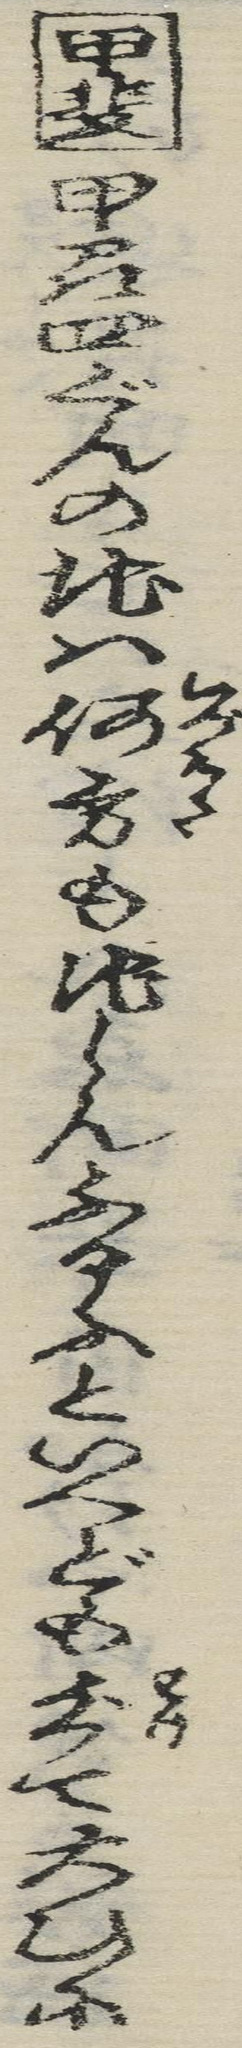甲斐甲州四ぐんの地は何方も地しんふるふといえども分て大ひに
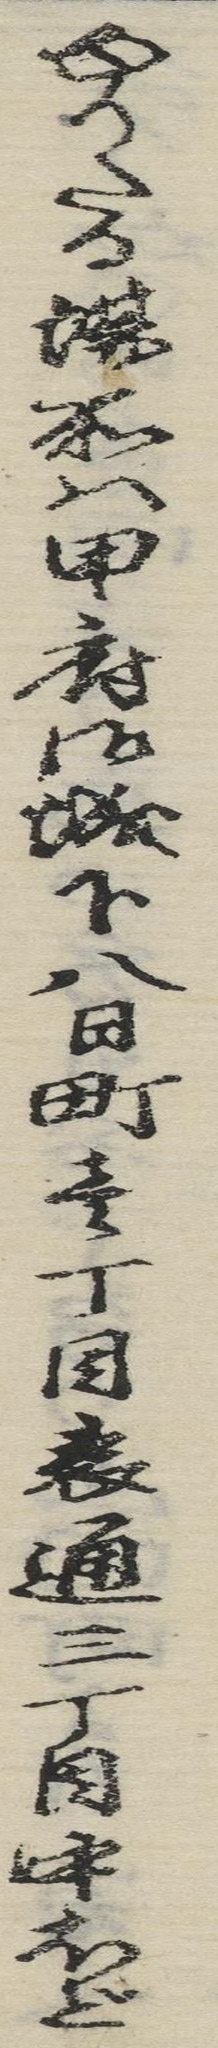ゆりたる場所は甲府御城下八日町壱丁目表通三丁目中ほど
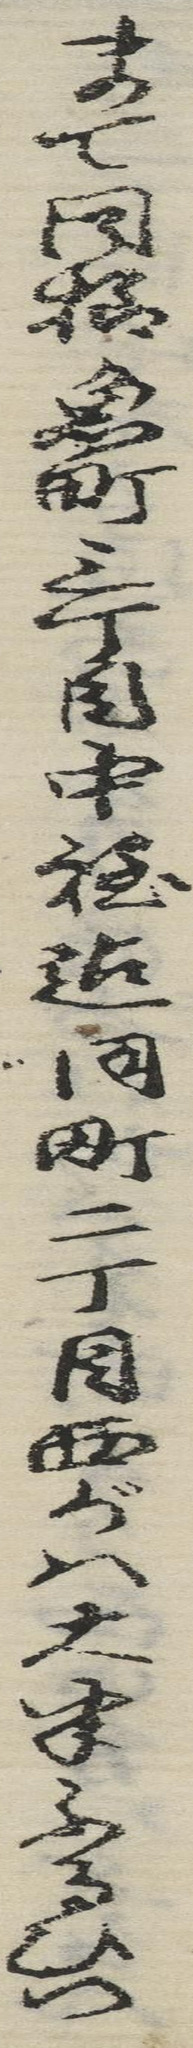まて同様魚町三丁目中程迄同町二丁目西がは大半ふるひつ
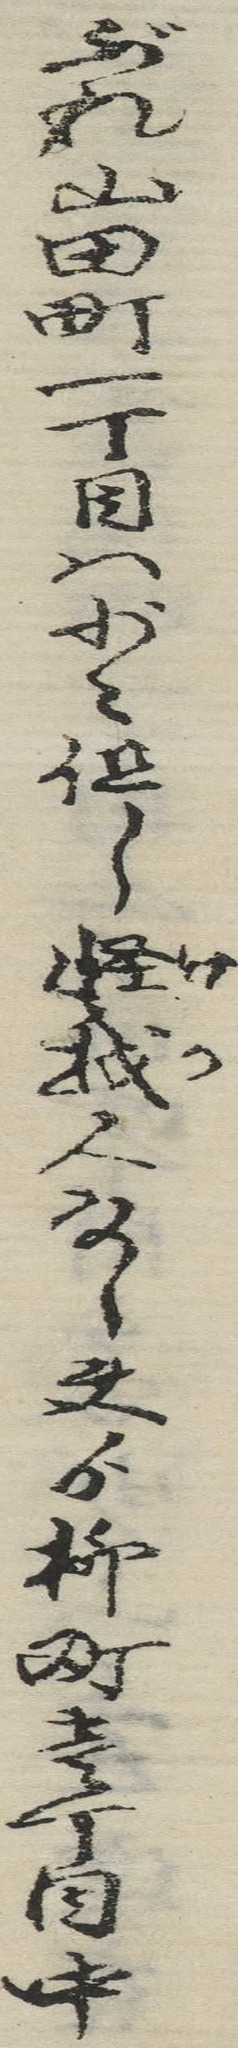ぶれ山田町一丁目は少々但し怪我人なし夫ゟ柳町壱丁目中
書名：諸国海辺地震津波書
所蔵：東京大学地震研究所図書室 Earthquake Research Institute Library, The University of Tokyo, JAPAN
